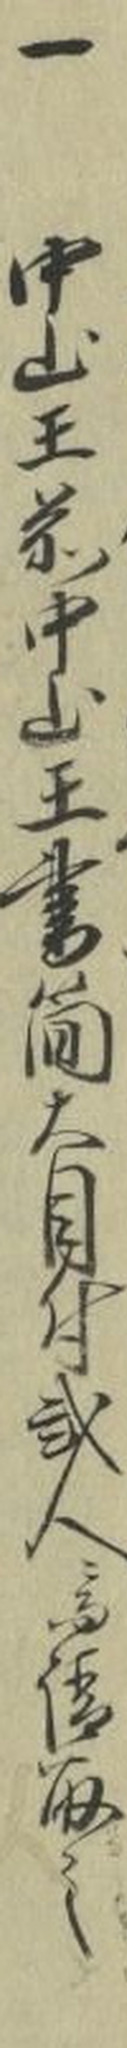一中山王前中山王書簡大目付弐人にて請取之
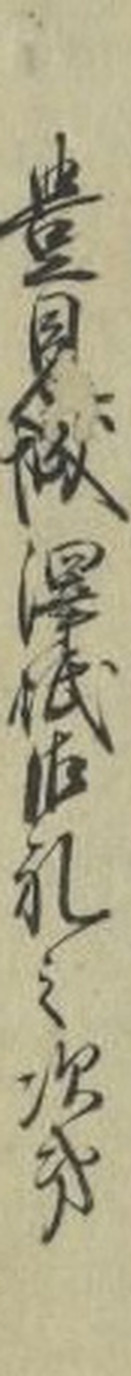豊見城沢岻御礼之次第
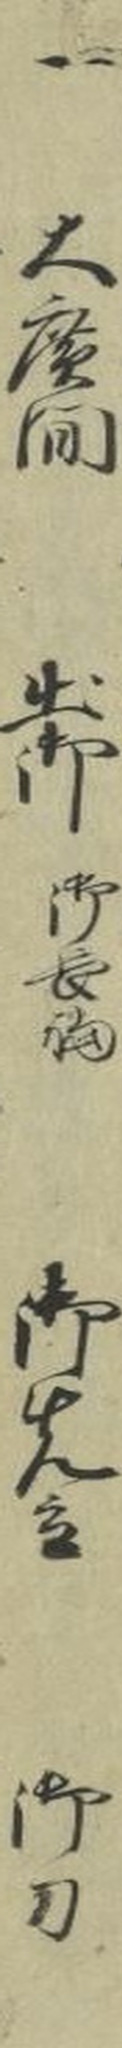一大広間出御御長襠御先立御刀
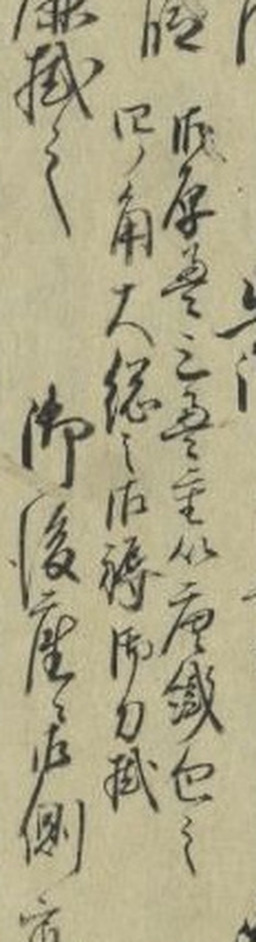四の角大総之御褥御刀掛
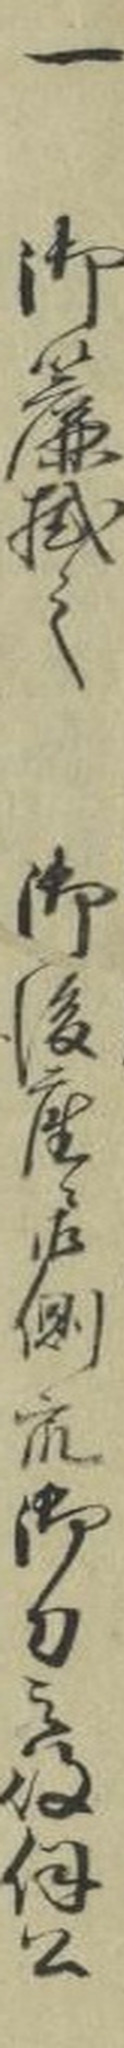一御簾掛之御後座に御側衆御刀之役伺公
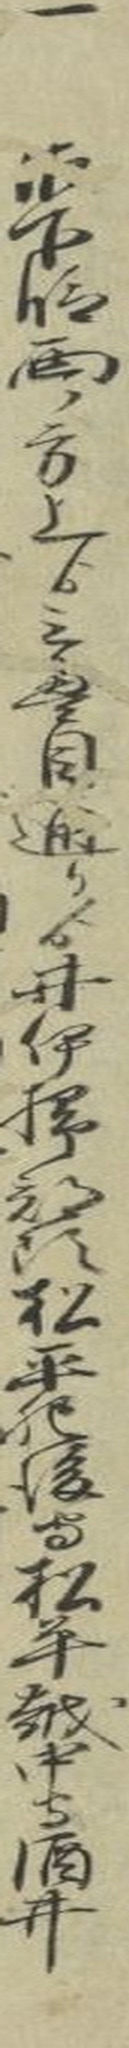一御下段西の方上ゟ三畳目通りゟ井伊掃部頭松平肥後守松平越中守酒井
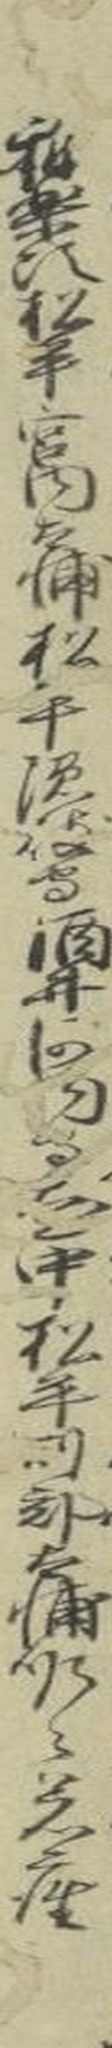雅楽頭松平宮内太輔松平隠岐守酒井河内守老中松平刑部太輔順々着座
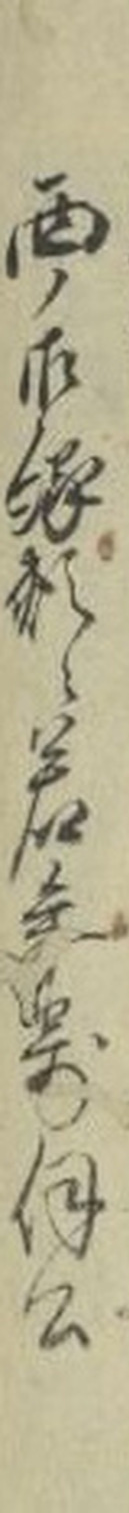一西の御縁頬に若年寄伺公
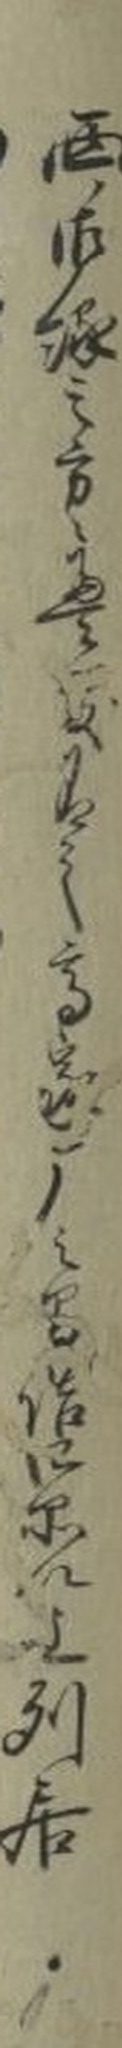一西の御縁之方に畳敷有之高家鴈之間詰四品以上列居
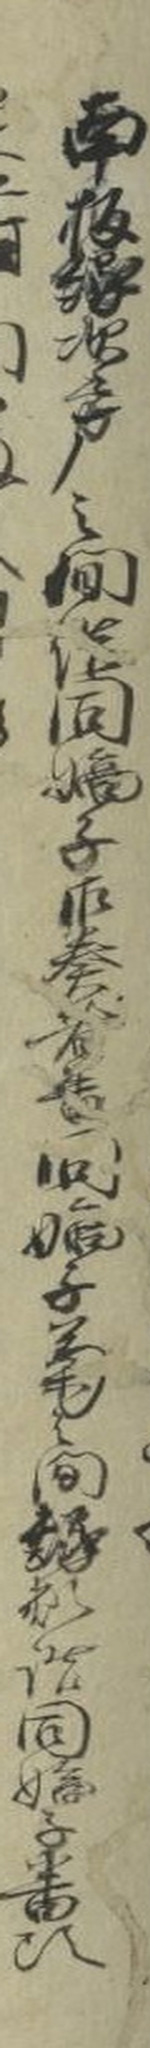一南板縁次に鴈之間詰同嫡子御奏者番同嫡子菊之間縁頬詰同嫡子番頭
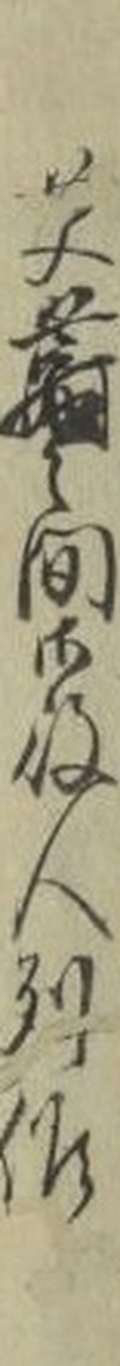芙蓉之間御役人列候
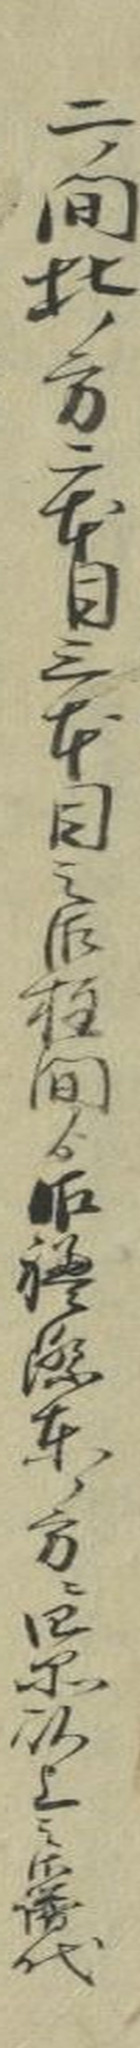一二の間北の方二本目三本目之御柱間ゟ御襖際の方に四品以上之御譜代
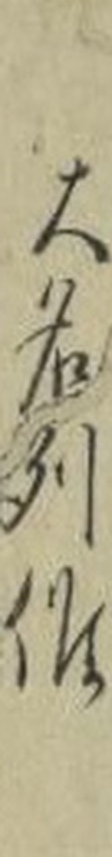大名列候
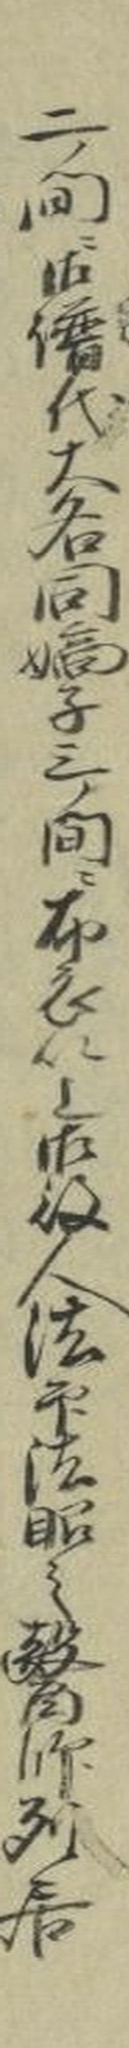一二の間に御譜代大名同嫡子三の間に布衣以上御役人法印法眼之医師列居
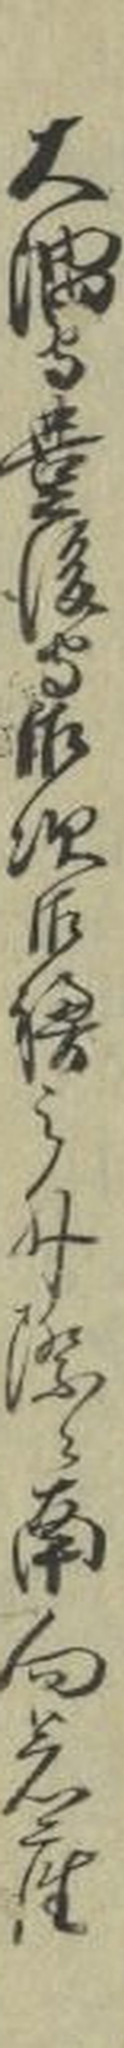一大隅守豊後守御次御襖之外際に南向着座
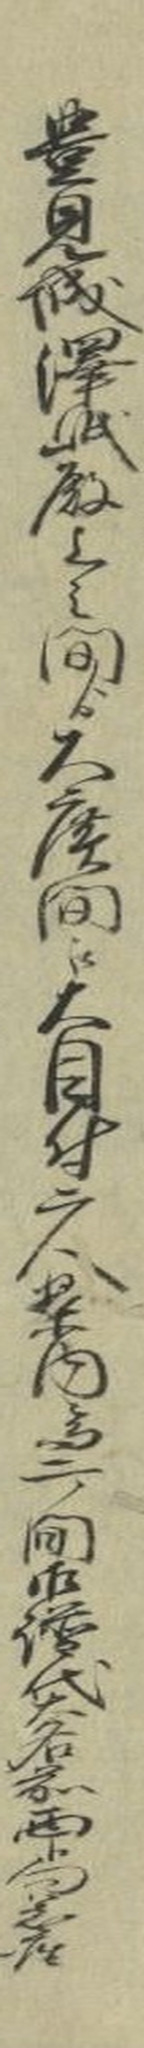一豊見城沢岻殿上之間ゟ大広間え大目付二人案内にて二の間御譜代大名前西向着座
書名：天保三壬辰年琉球人参府之節勤方書留
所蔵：University of the Ryukyus Library
